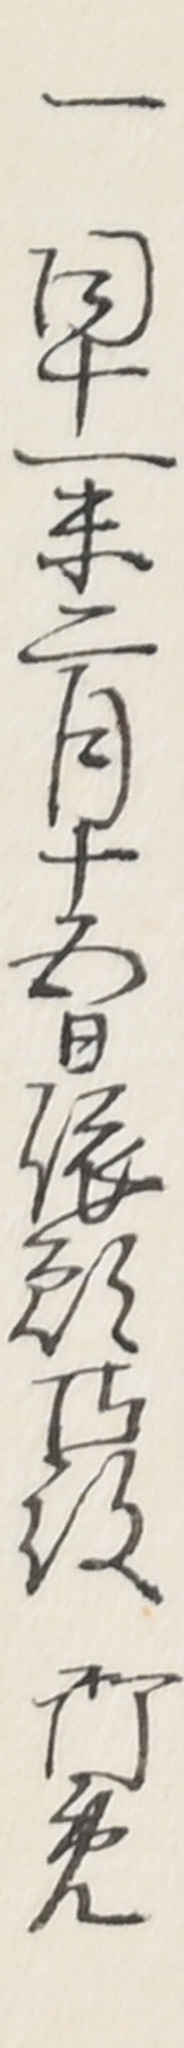一同十一未二月十五日依願御役御免
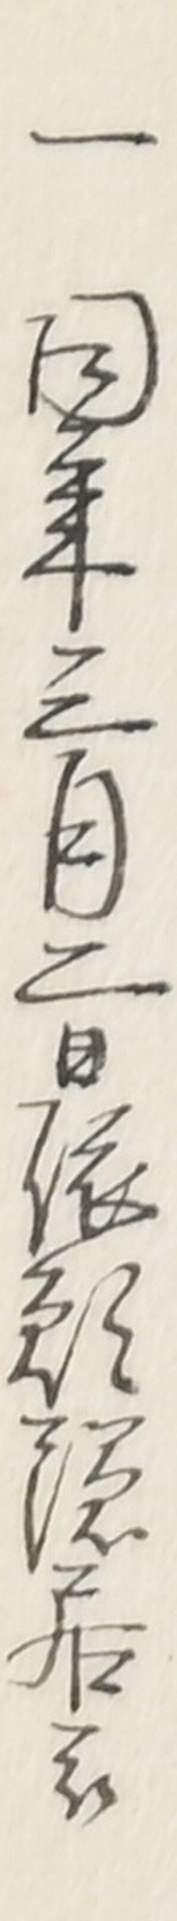一同年三月二日依願隠居被
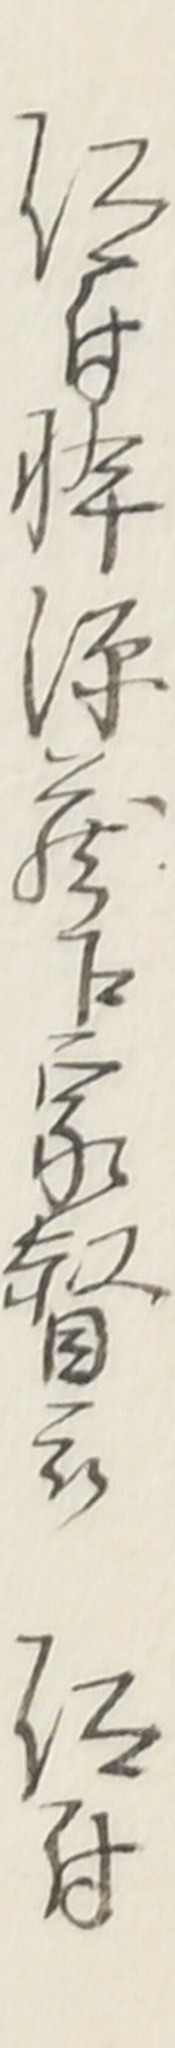仰付忰源蔵江家督被仰付
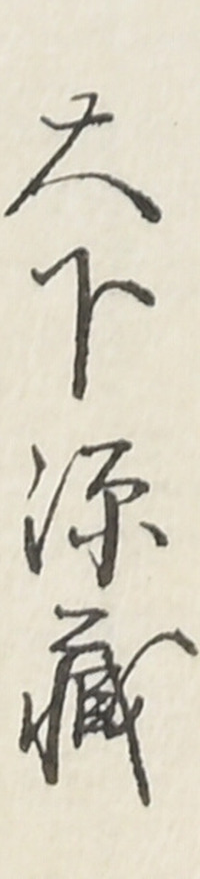大下源蔵
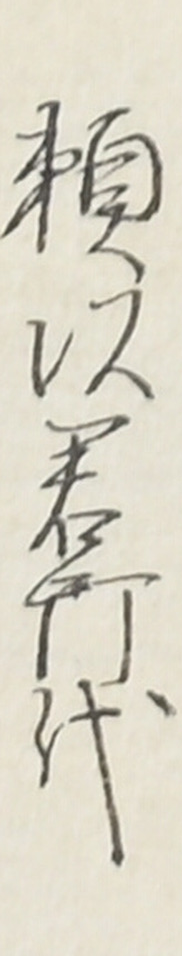頼以君御代
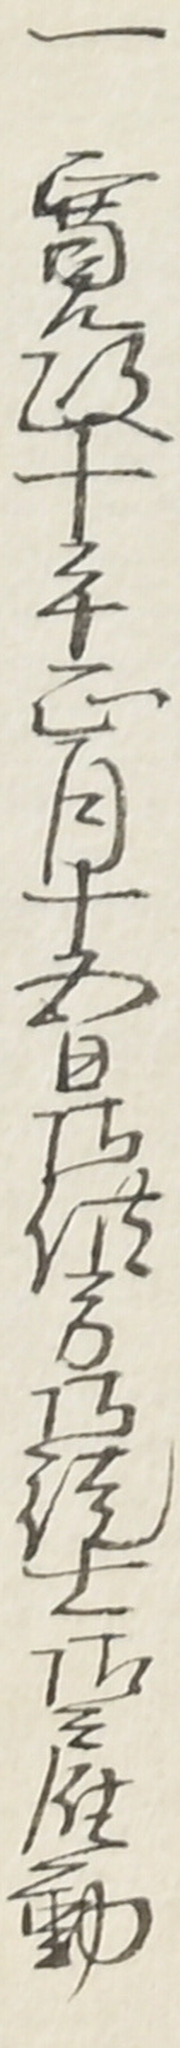一寛政十午正月十五日御供方御徒士御雇勤
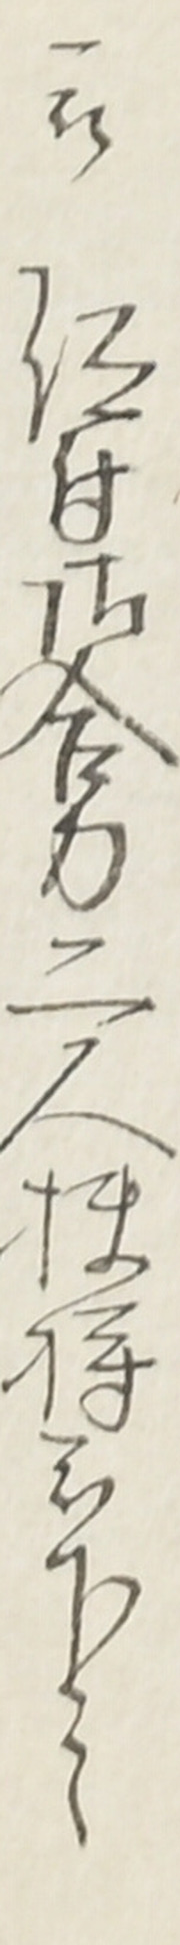被仰付御合力二人扶持被下之
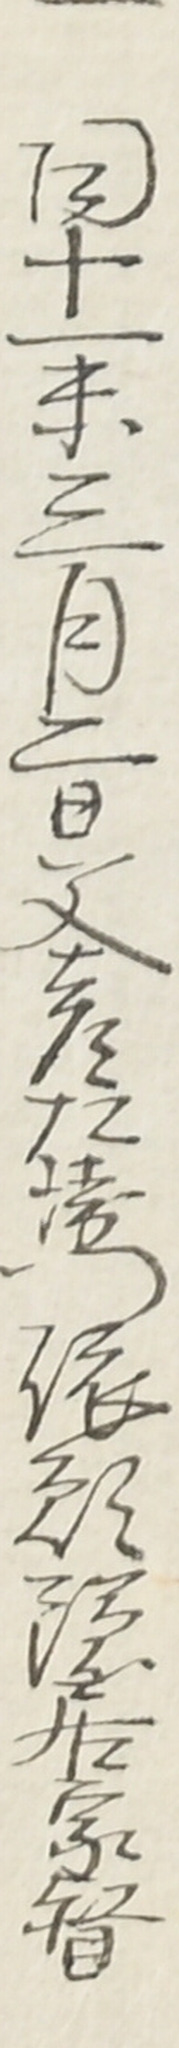一同十一未三月二日父彦左衛門依願隠居家督
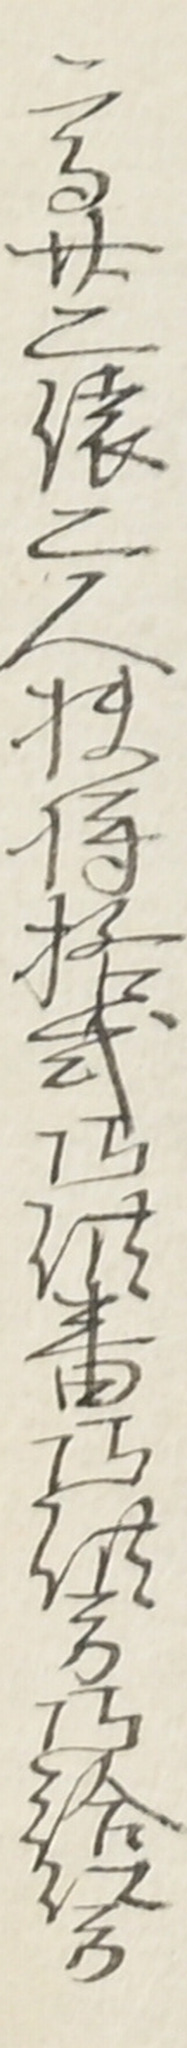高廿二俵二人扶持格式御供番御供方御給仕方
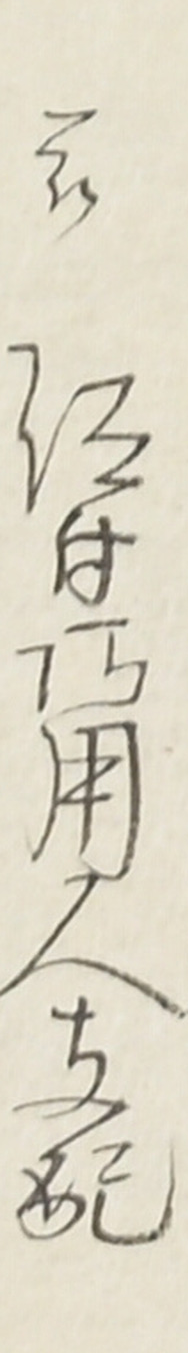被仰付御用人支配
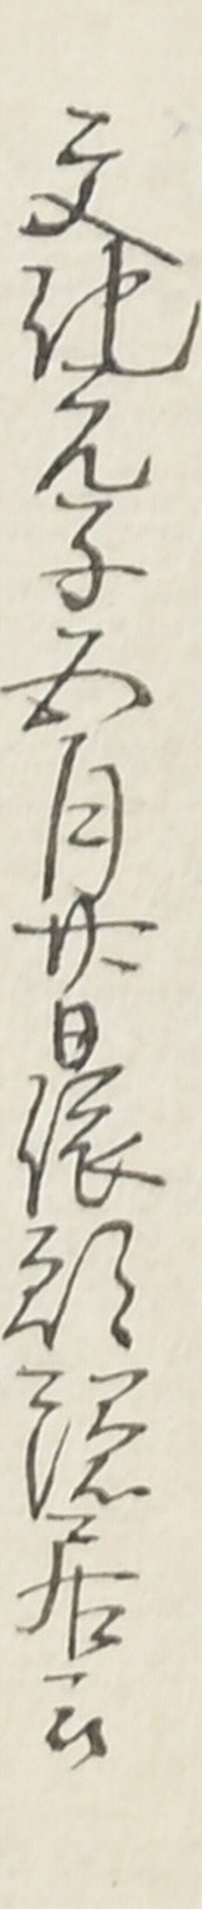一文化元子五月廿日依願隠居被
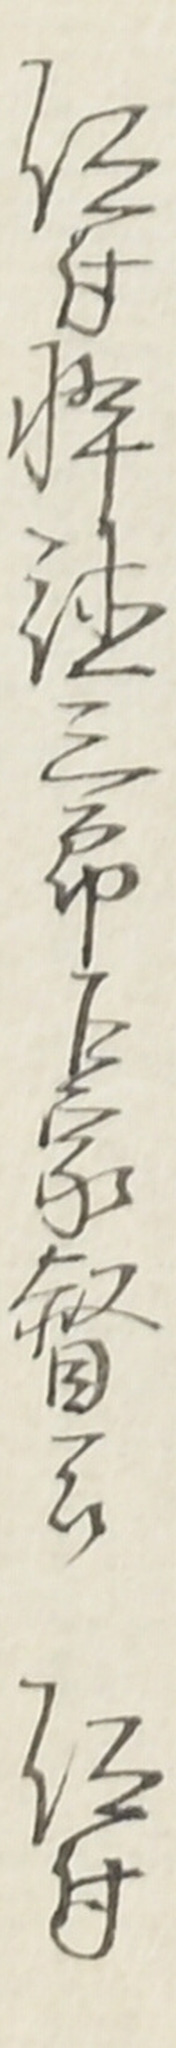仰付忰徳三郎江家督被仰付

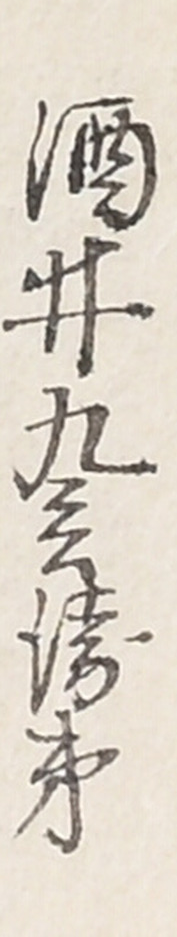酒井九兵衛弟
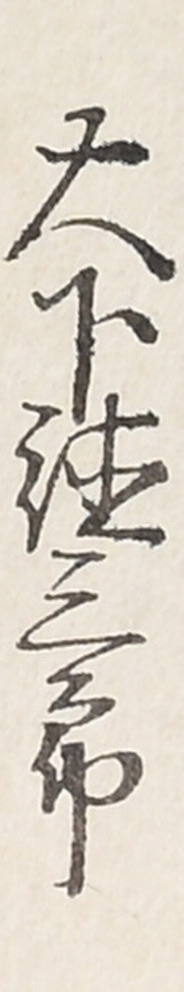大下徳三郎
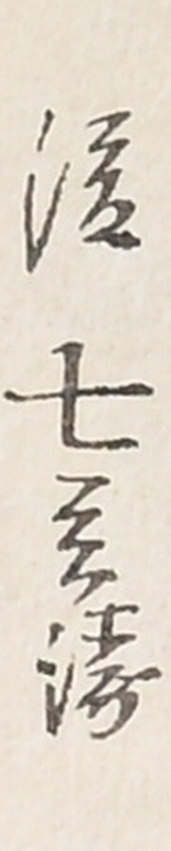後七兵衛
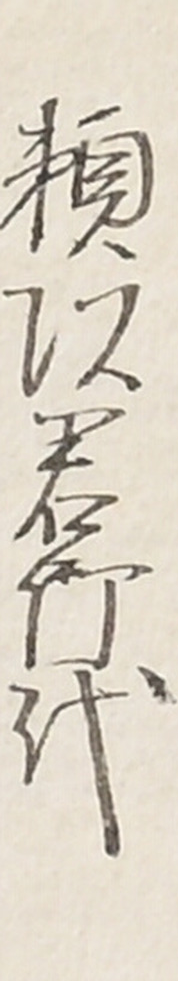頼以君御代
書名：無足諸士勤仕録（四）
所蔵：伊那市立高遠町図書館・合同会社AMANE
